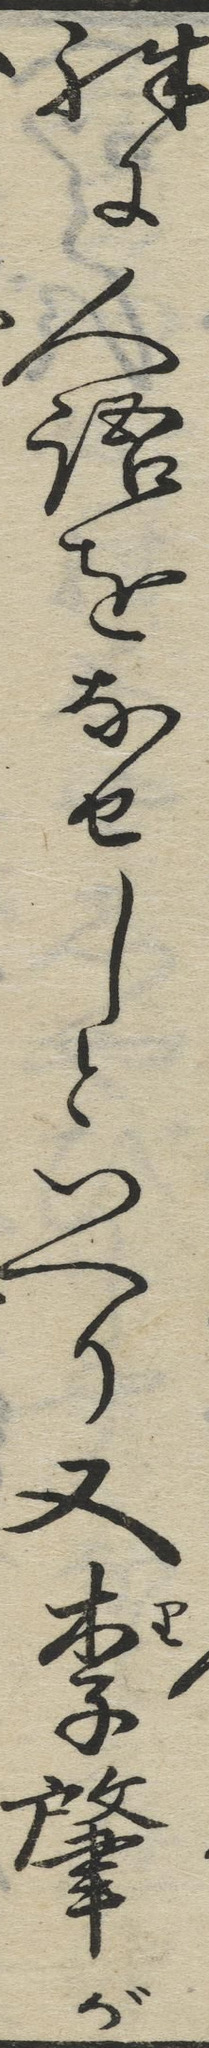殊に人語をなセしといへり又李肇が
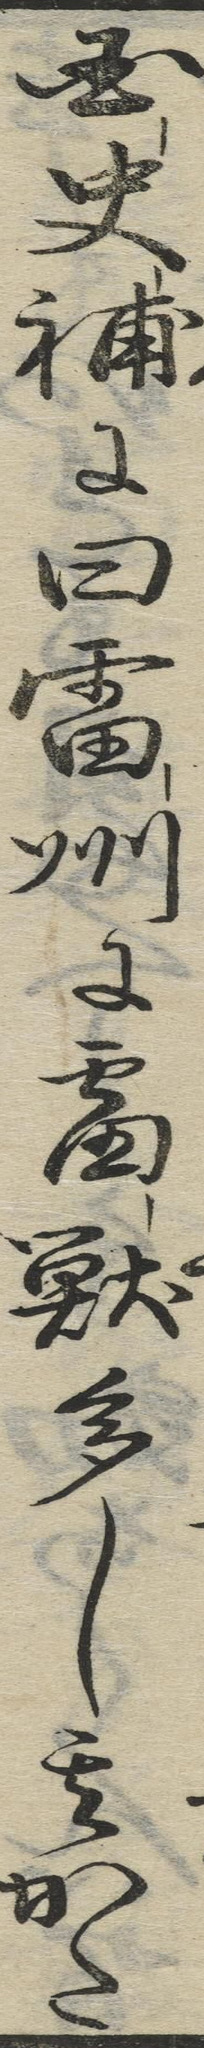国史補に日雷州に雷獣多し其かた
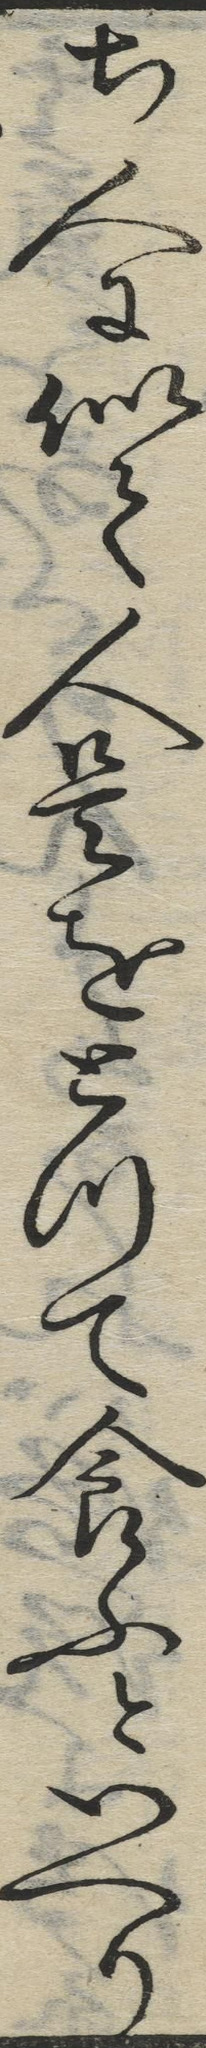ち人に似て人是をとつて食ふといへり
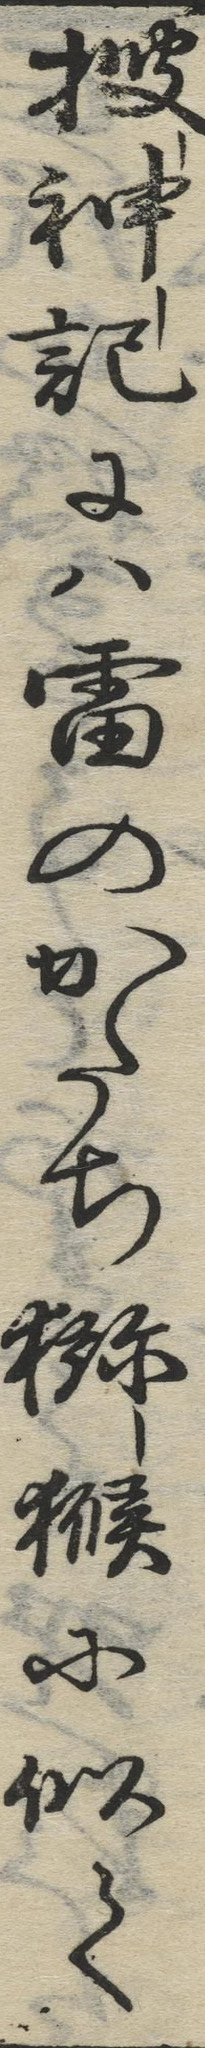捜神記にハ雷のかたち獅猴に似て
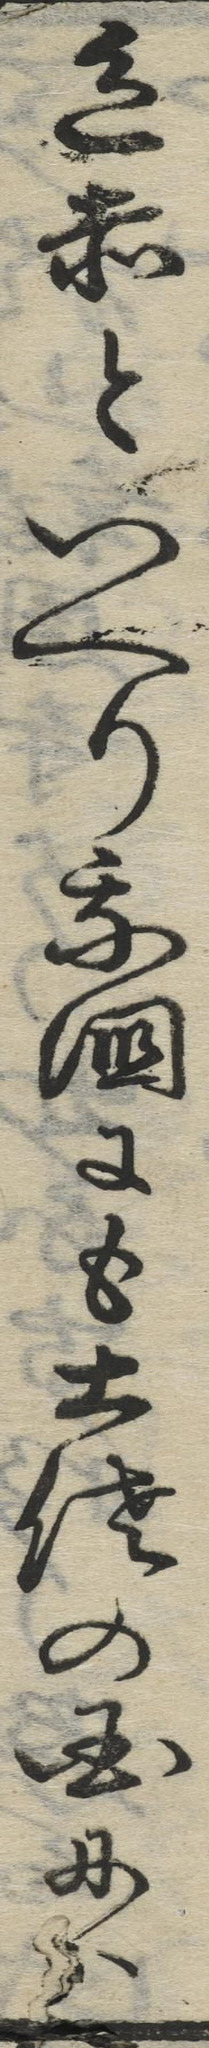色赤といへり我国にも土佐の国にハ
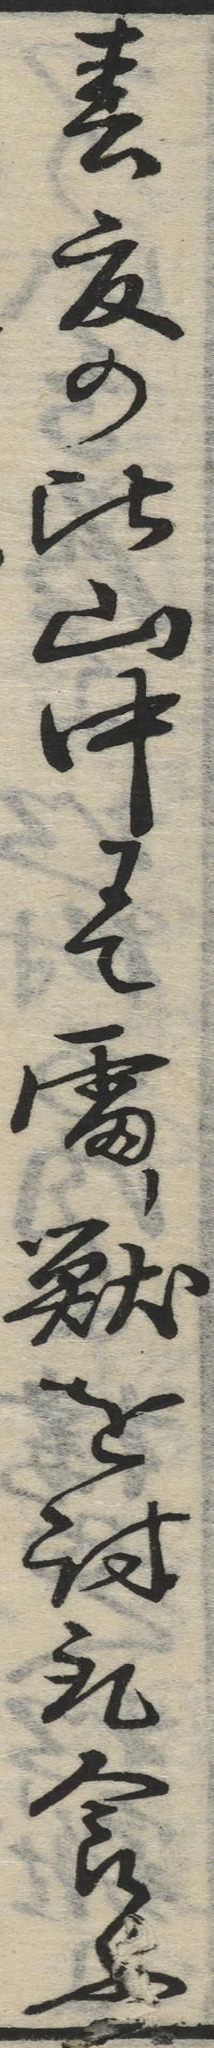春夏の比山中にて雷ノ獣を討取食ふ
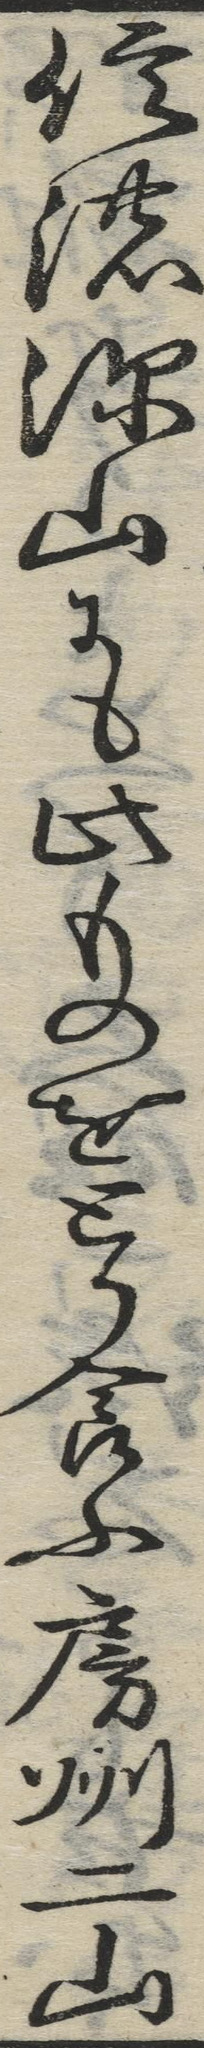信濃深山にも此ものをとり食ふ房州二山
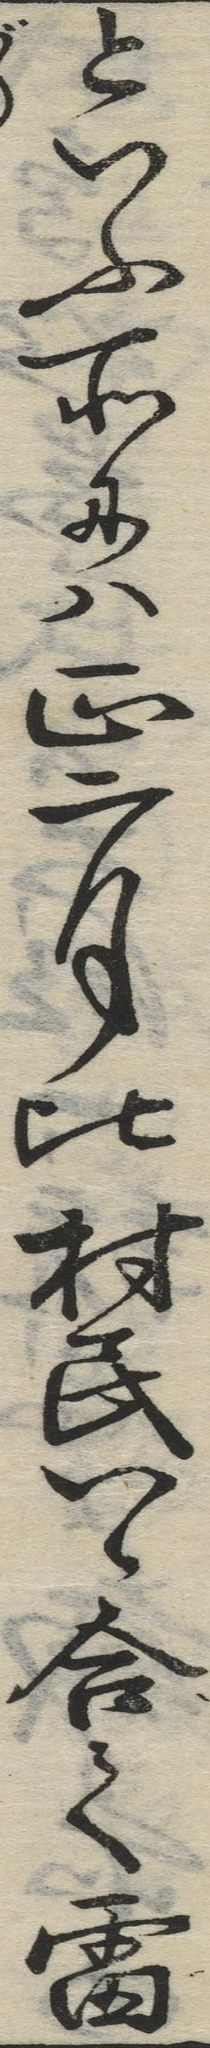といふ所にハ正二月比村民いゝ合て雷
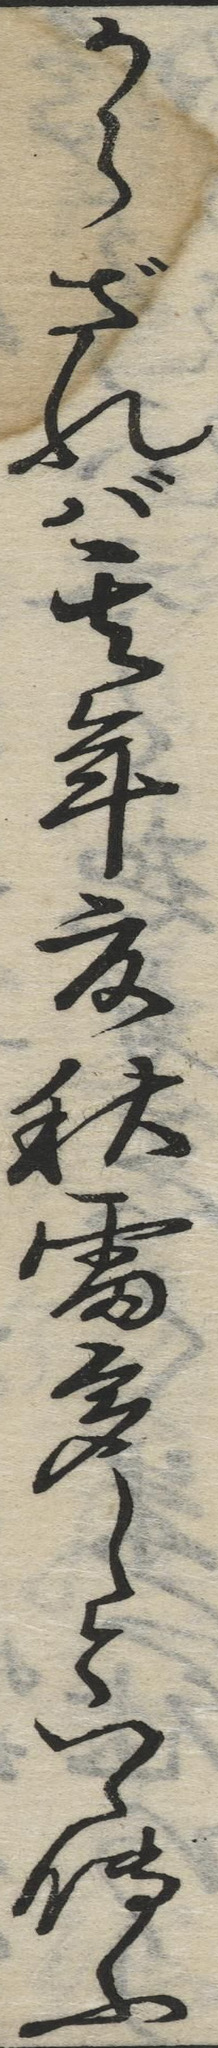からざれバ其年夏秋雷多しといゝ伝ふ
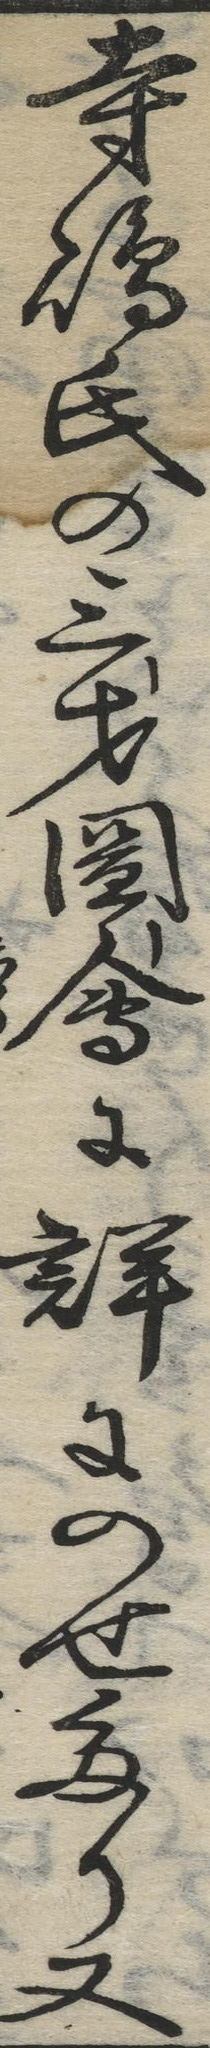寺嶋氏の三才図絵に詳にのせたり又
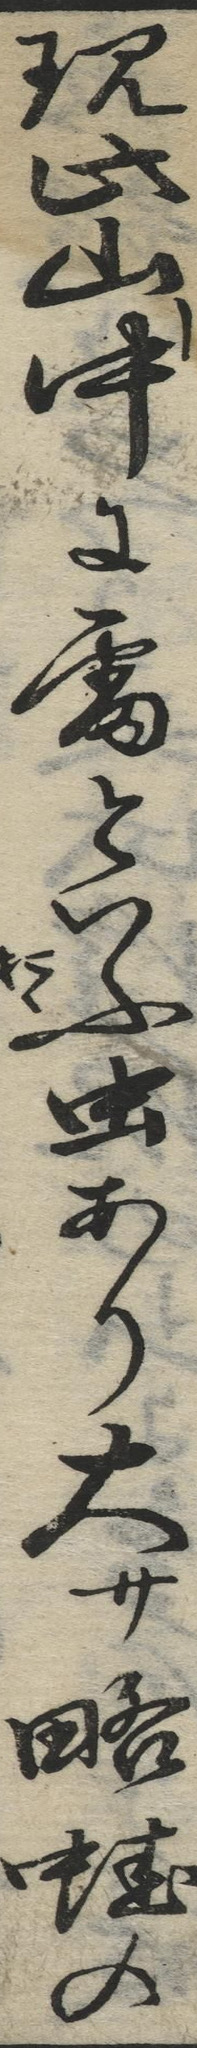現此山中に雷といふ虫あり大サ略蛙の

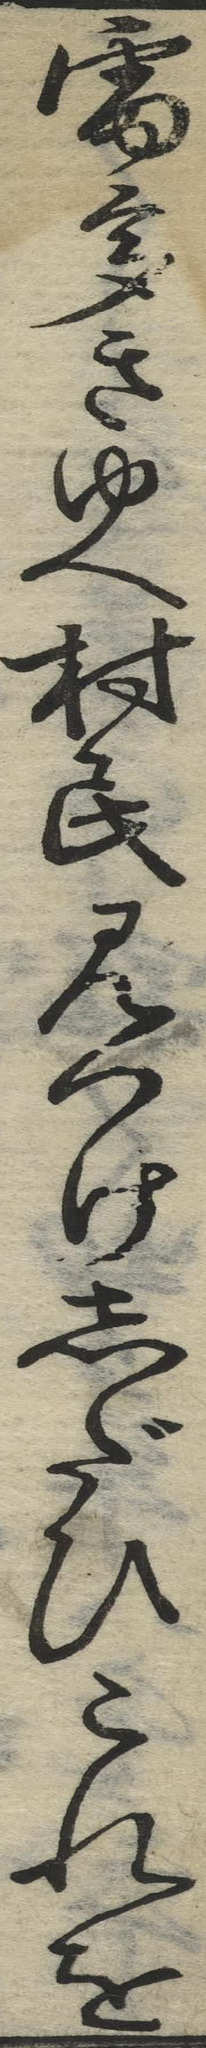雷多きゆへ村民見つけしだひこれを
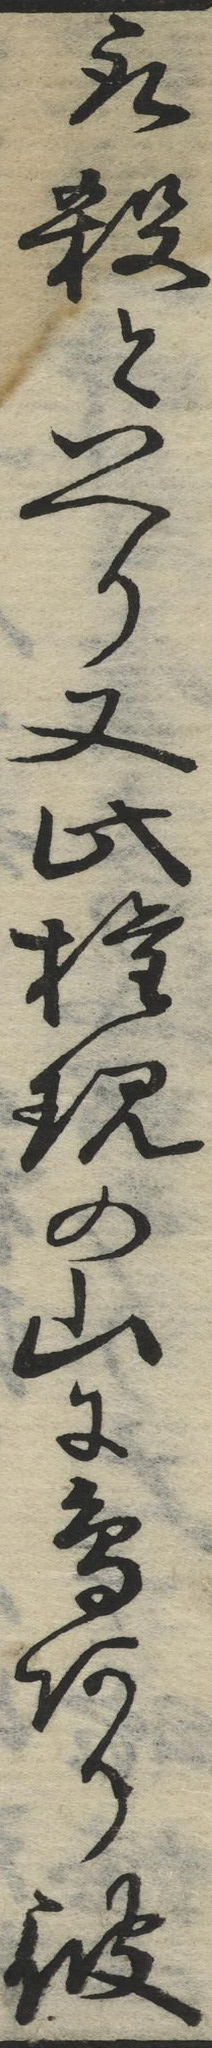取殺といへり又此権現の山に鳥あり彼
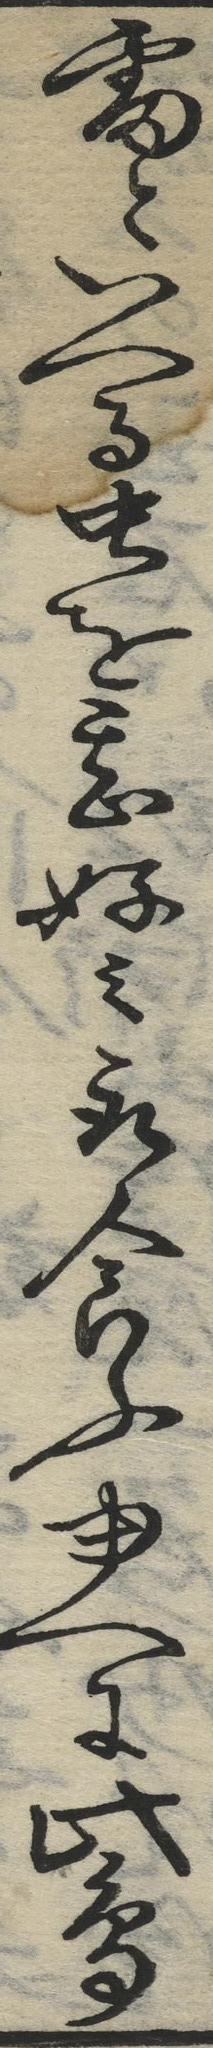雷といへる虫を甚好み取食ふ由へに此鳥
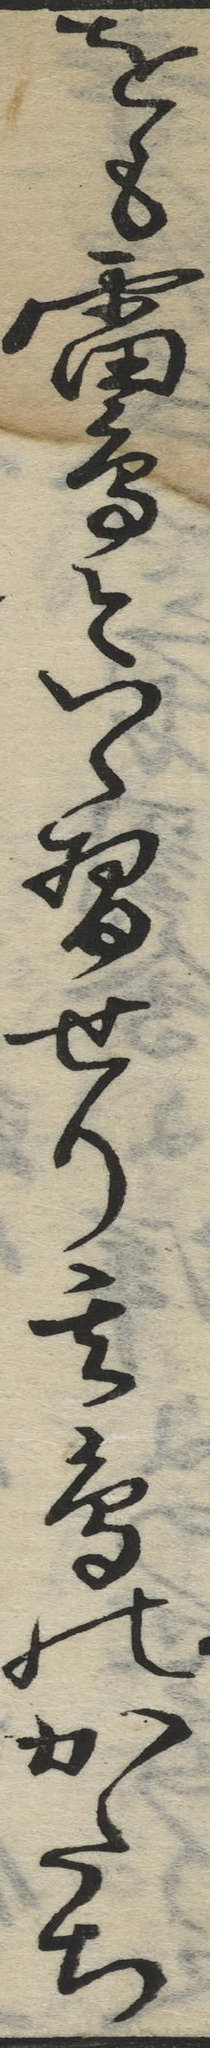をも雷鳥といゝ習せり其鳥のかたり
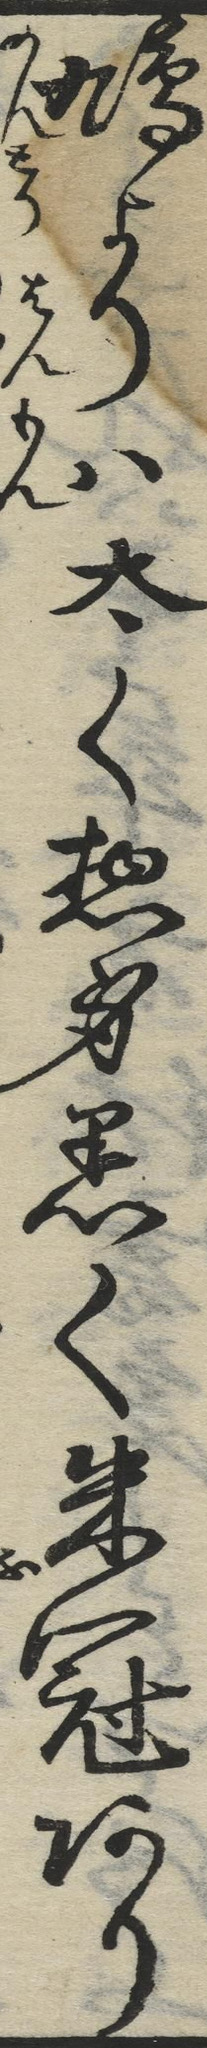鳩よりハ太く惣身黒く朱冠あり
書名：雷震記　完
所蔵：東京大学地震研究所図書室 Earthquake Research Institute Library, The University of Tokyo, JAPAN
